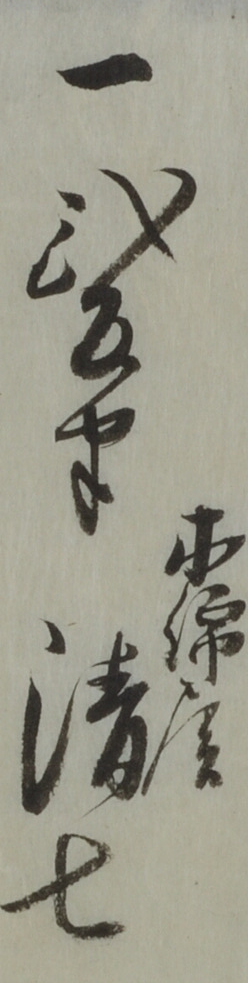一弐反半清七
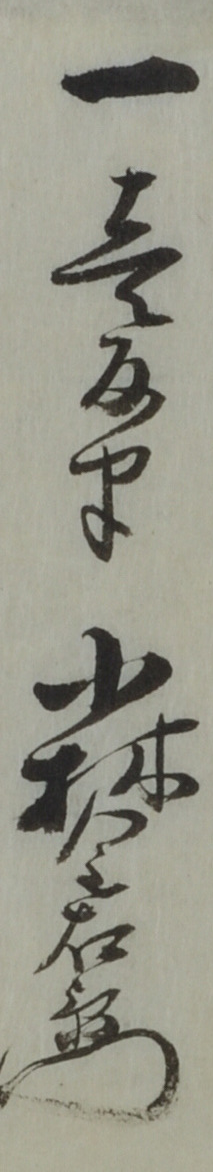一壱反半小林金右衛門
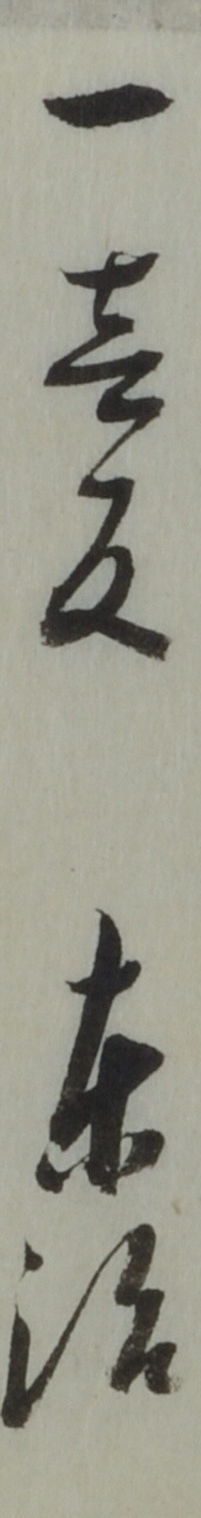一壱反東治
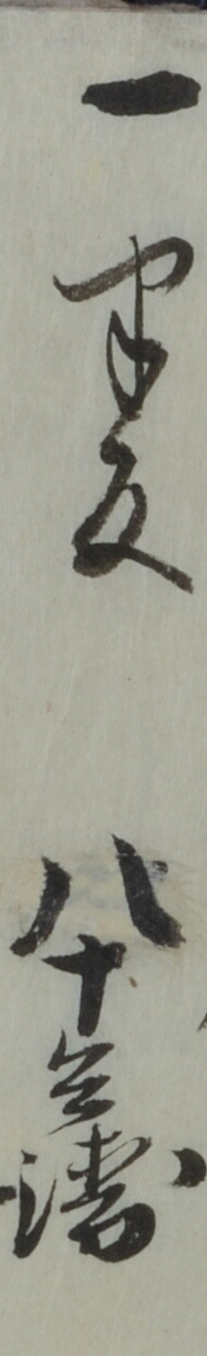一半反八十兵衛

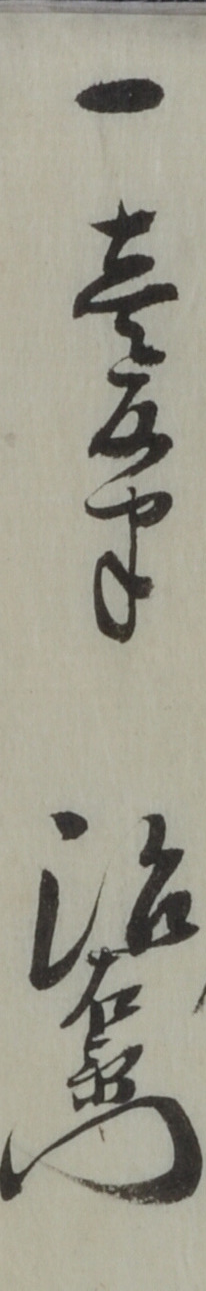一壱反半治右衛門
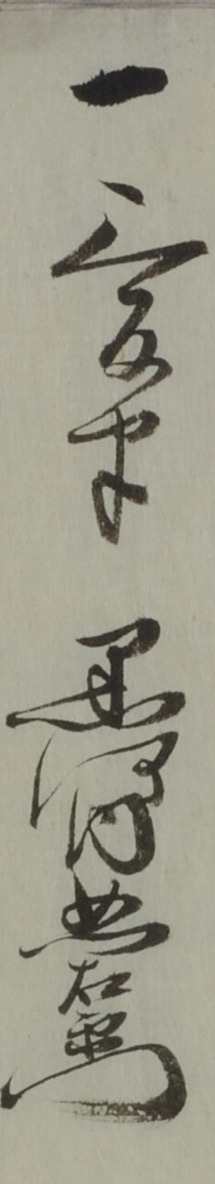一三反半黒河内恕右衛門
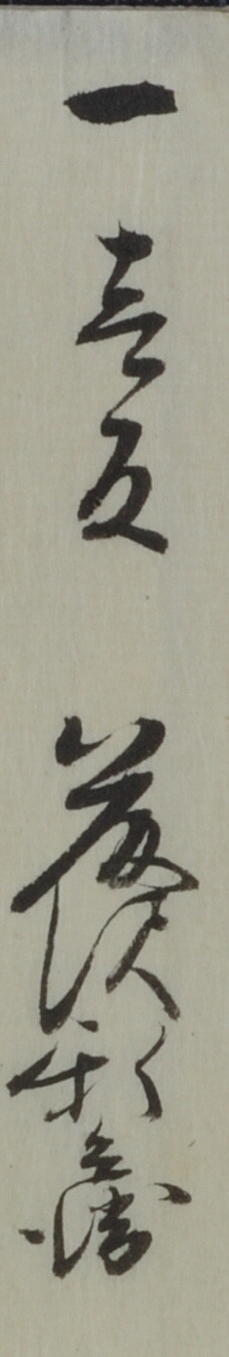一壱反藤沢新兵衛
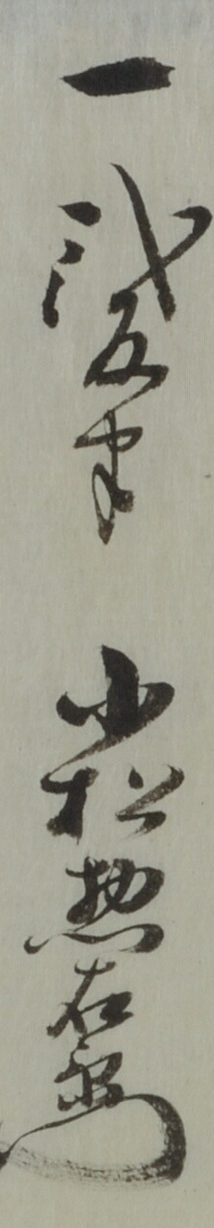一弐反半小松惣右衛門
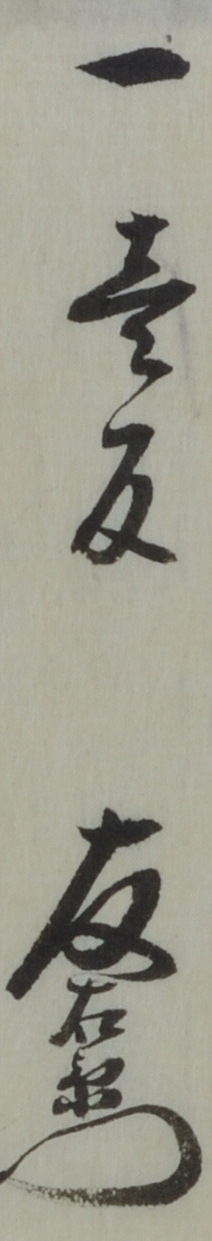一壱反友右衛門

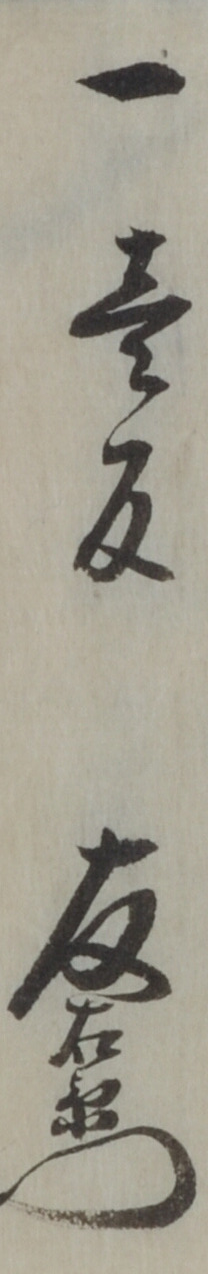一弐反半友右衛門
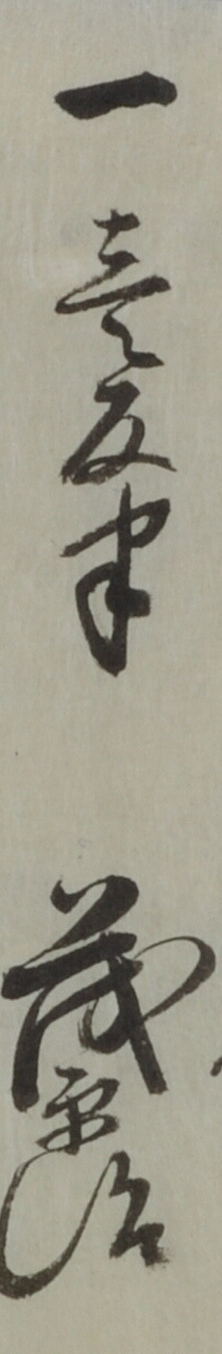一壱反半茂衛治
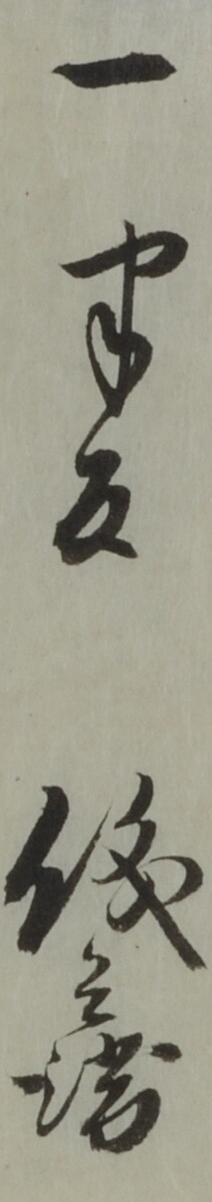一半反義兵衛
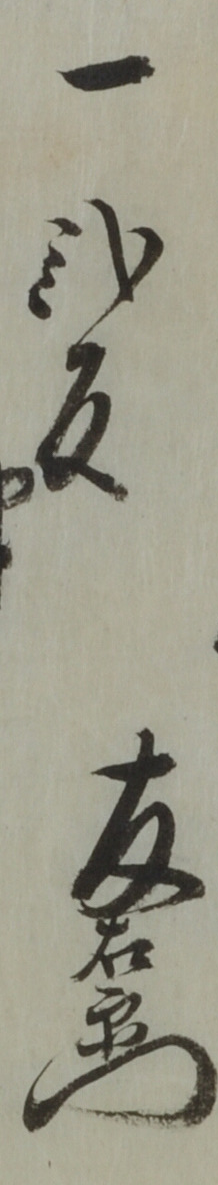一弐反半友右衛門
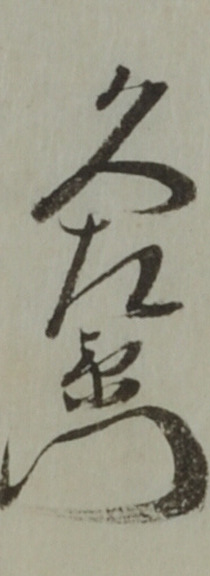久左衛門
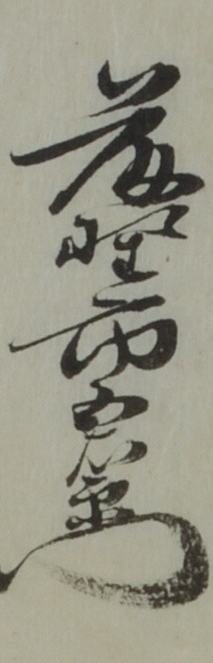一藤野市五右衛門

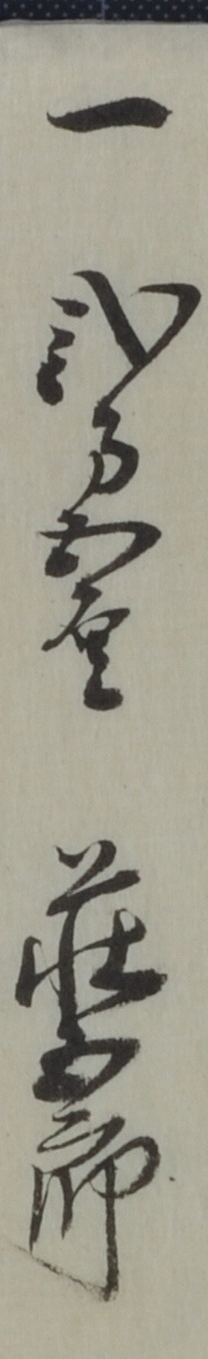一弐分五厘荘五郎
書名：融通割合帳
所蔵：伊那市立高遠町図書館・合同会社AMANE
